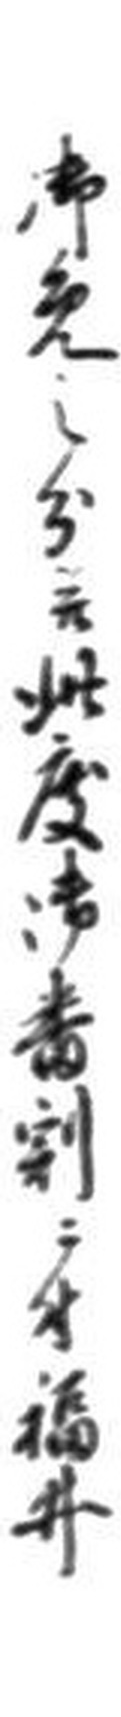御免之分并此度御番割ニ付福井
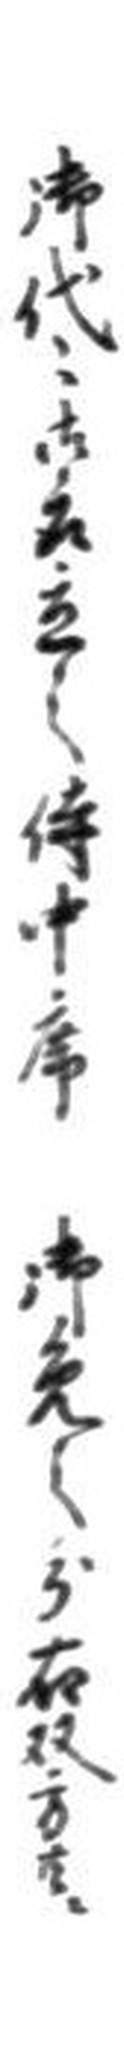御代々御取立之侍中席御免之分右双方共ニ
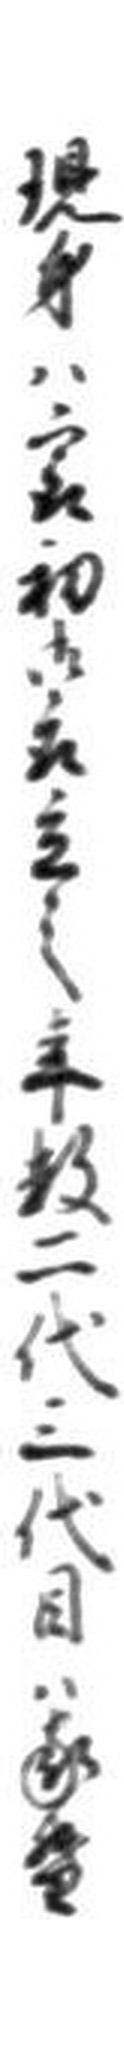現身ハ最初御取立之年数二代三代目ハ家督
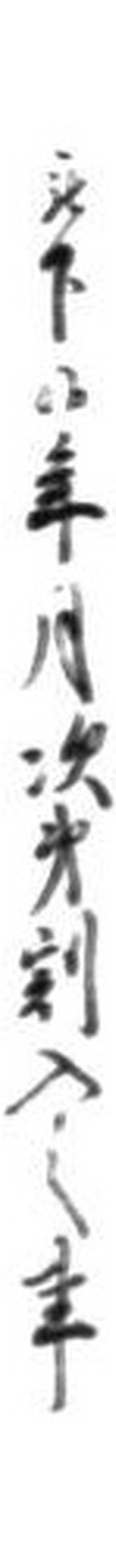被下候年月次第割入之事
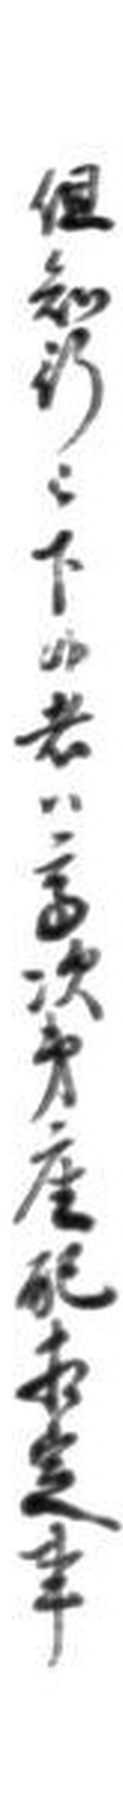但知行被下候者ハ高次第座配相定事
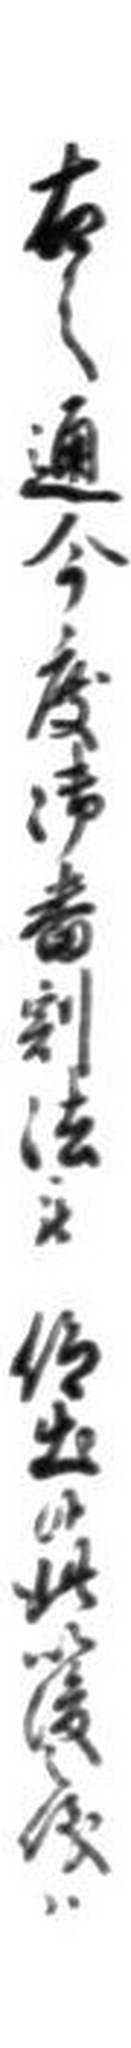右之通今度御番割法被仰出候此以後之儀ハ
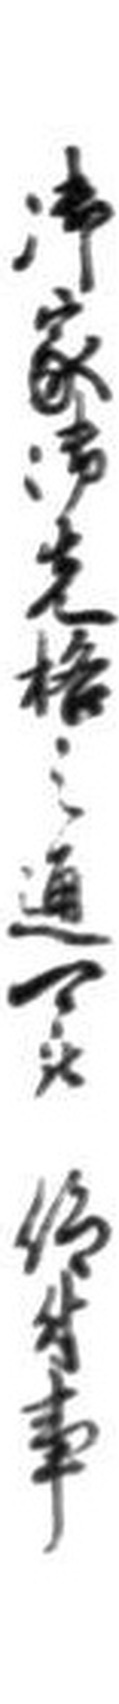御家御先格之通可被仰付事

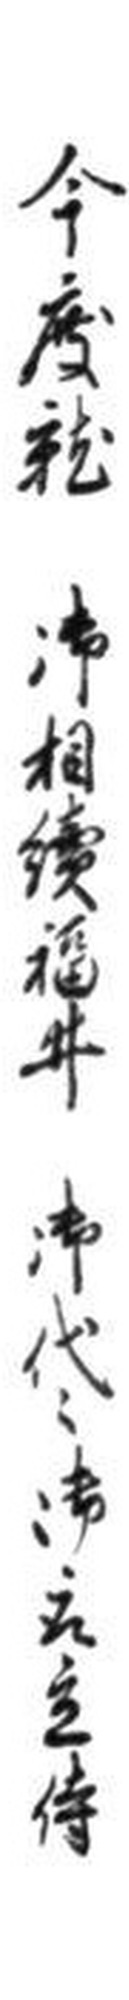今度就御相続福井御代々御取立侍
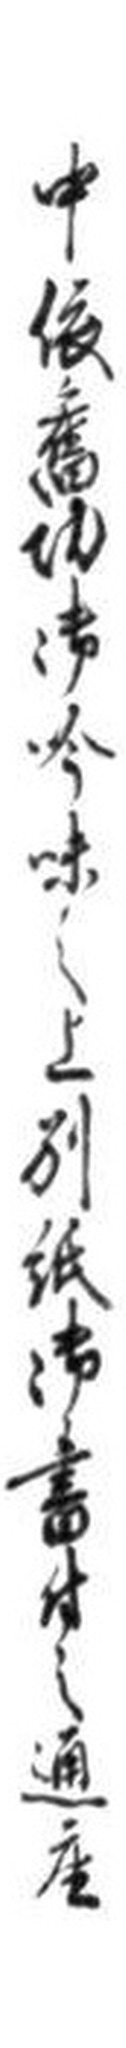中依旧功御吟味之上別紙御書付之通座
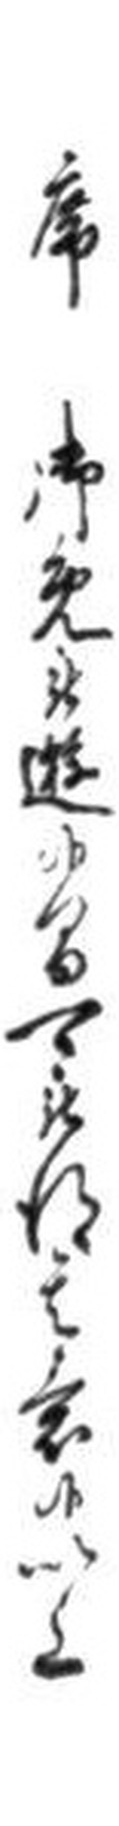席御免被遊候間可被得其意候以上
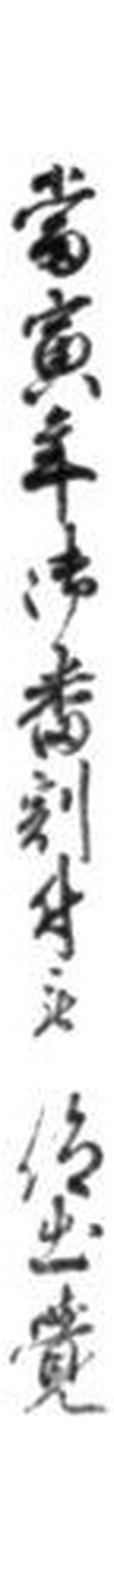当寅年御番割付被仰出覚
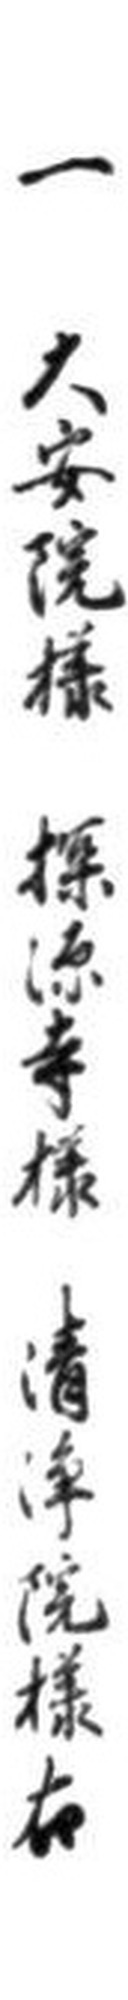一大安院様探源寺様清浄院様右
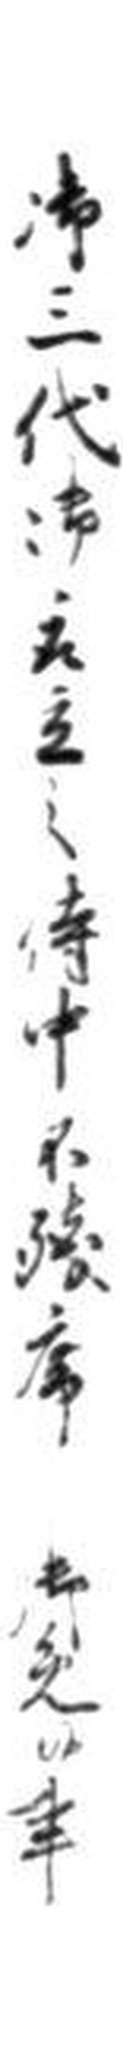御三代御取立之侍中不残席御免候事
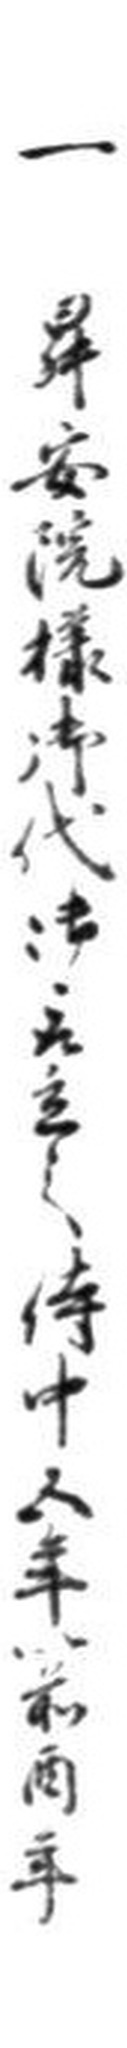一昇安院様御代御取立之侍中五年以前酉年
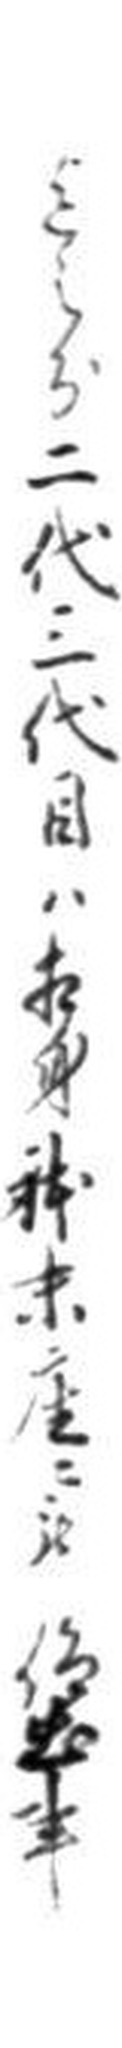迄之分二代三代目ハ相身体末座ニ被仰出事
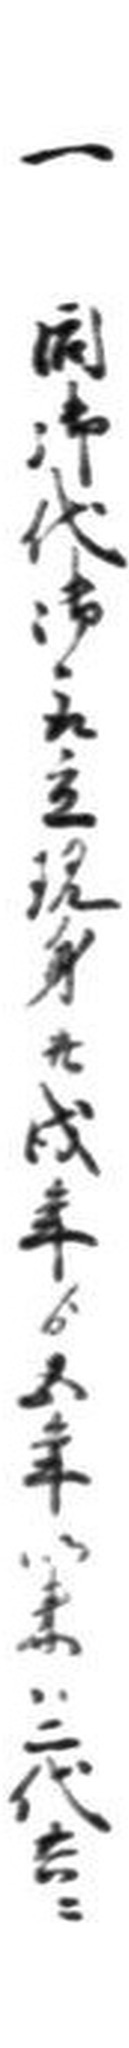一同御代御取立現身并戌年ゟ五年以来ハ二代共ニ
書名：家譜 三十五 宗昌公 従享保六年到同七年
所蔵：福井県文書館 Fukui Prefectural Archives
